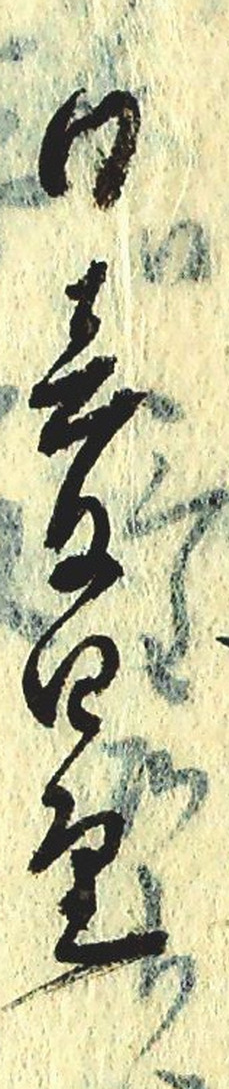同壱匁四厘
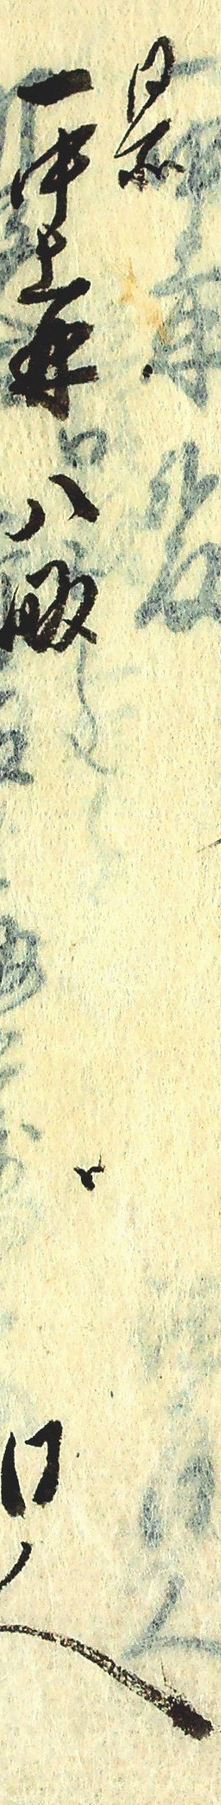一中上林八畝同人
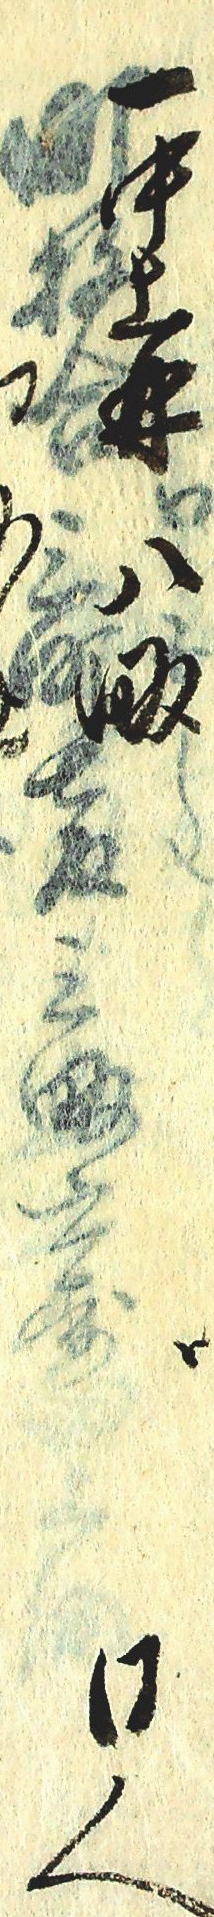一中上林八畝同人
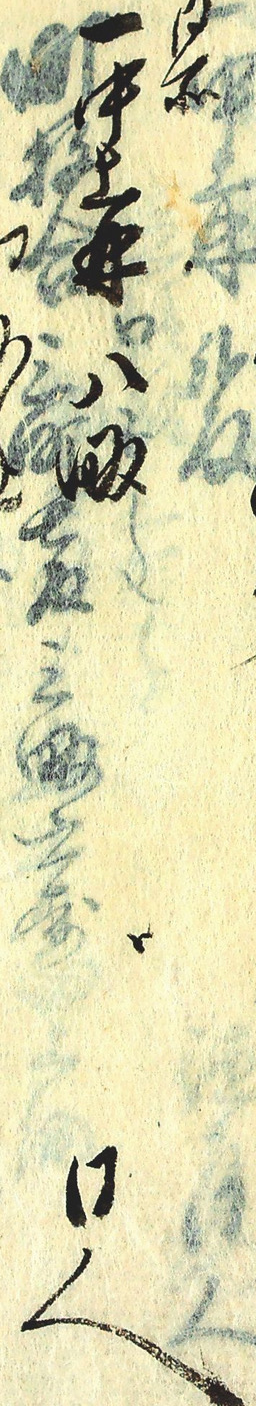一中上林八畝同人
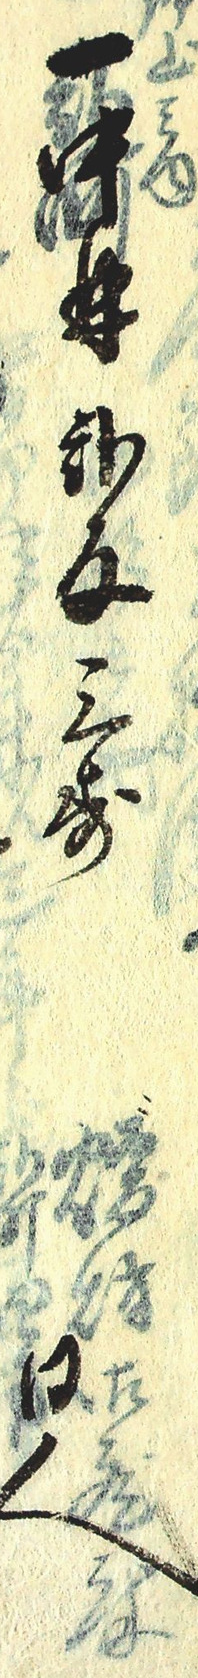一中林弐反三歩同人
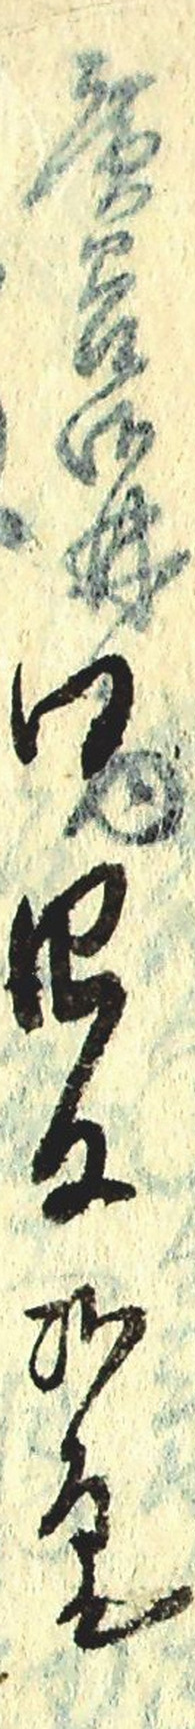同四匁弐厘
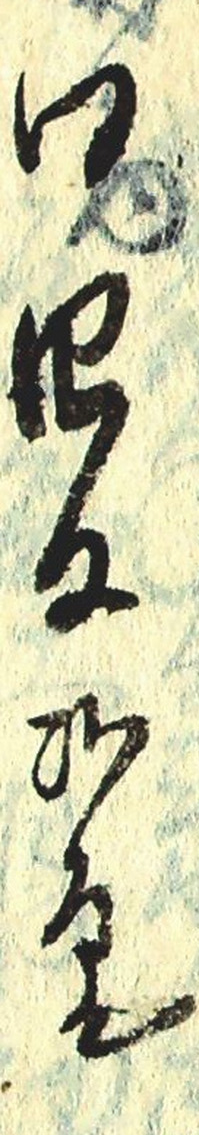同四匁弐厘

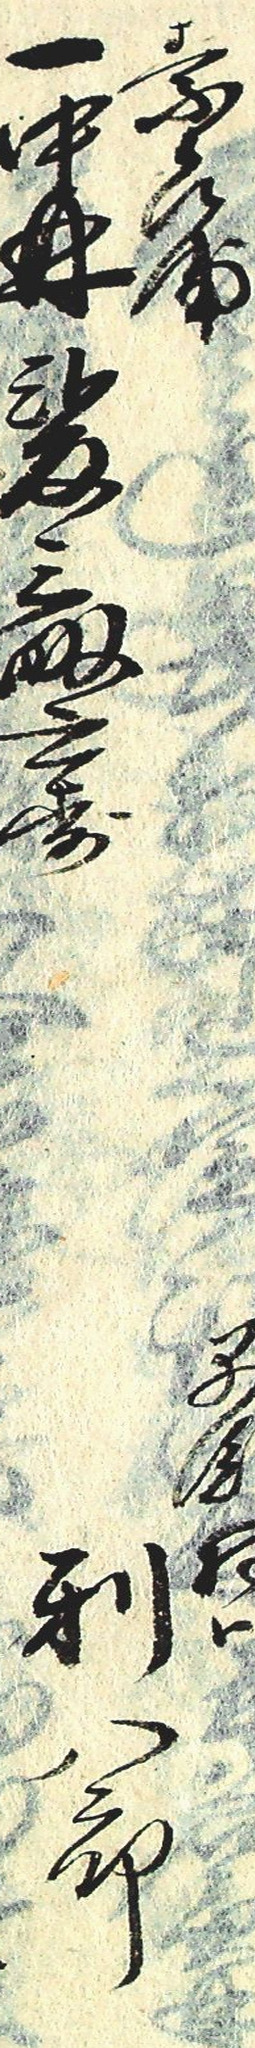一中林弐反三畝六歩利八郎
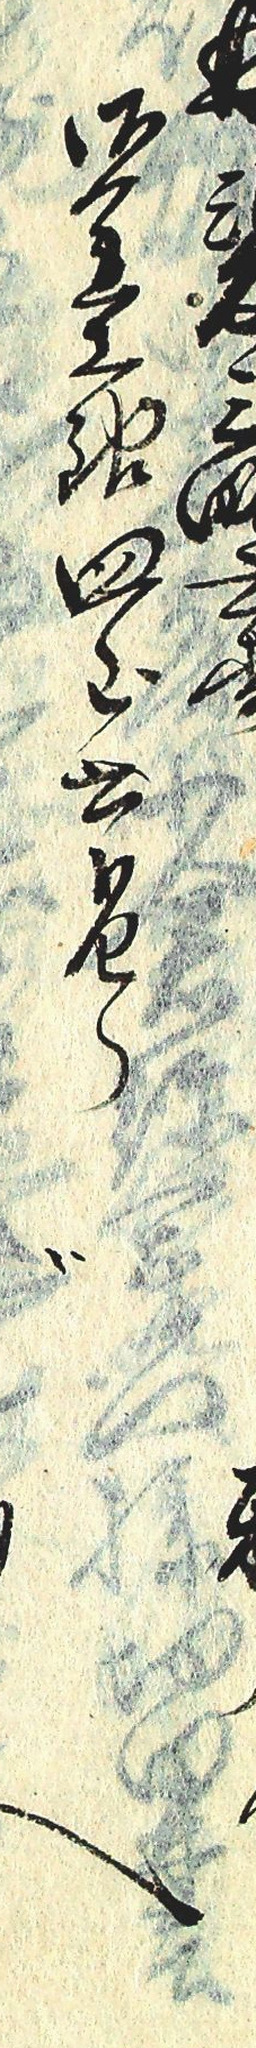御運上銀四匁六分四厘
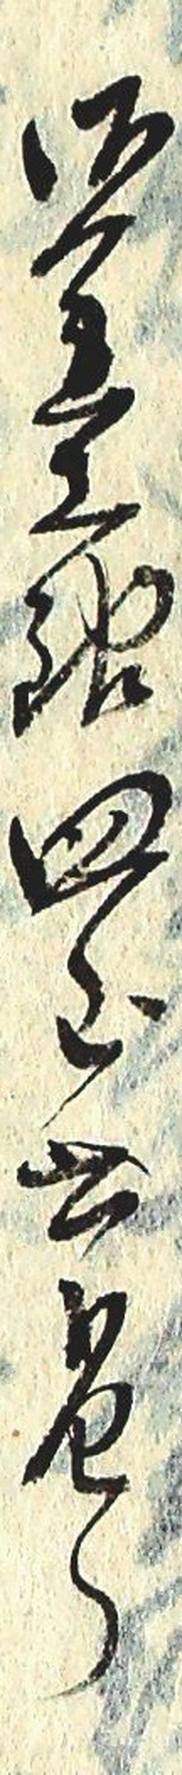御運上銀四匁六分四厘
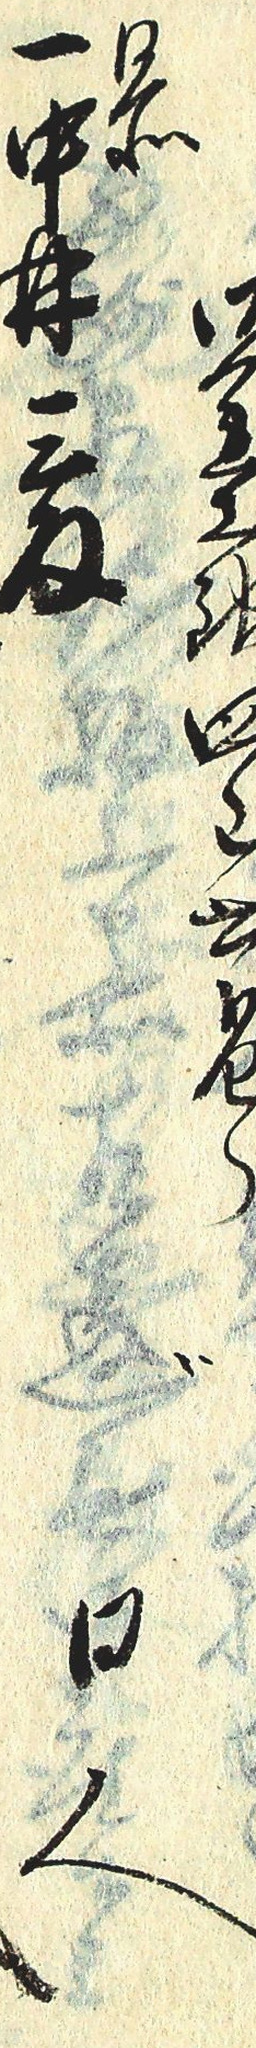一中林三反同人
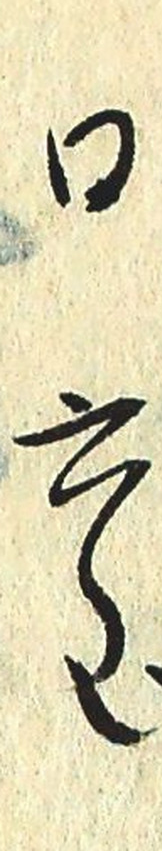同六匁
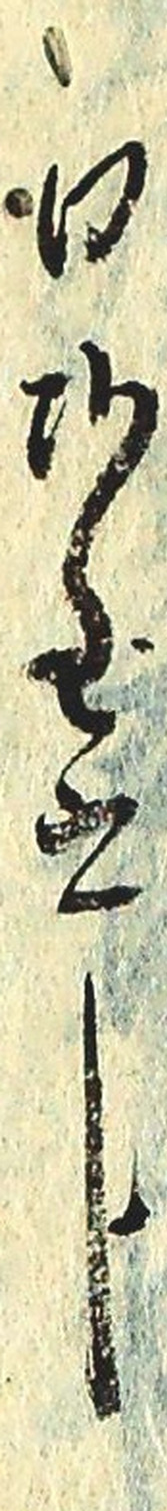同弐匁六分
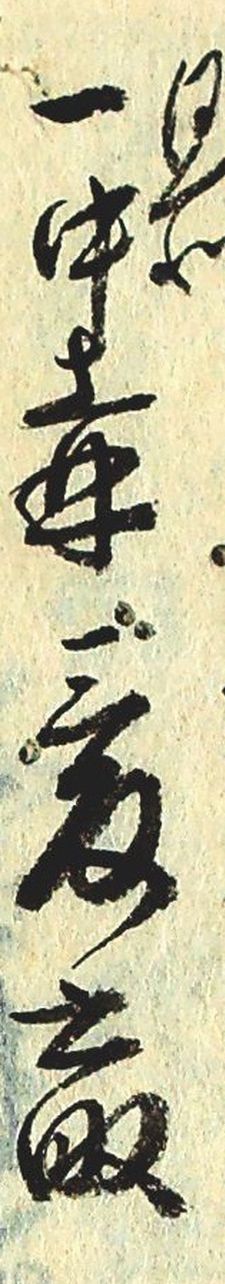一中林三反同人
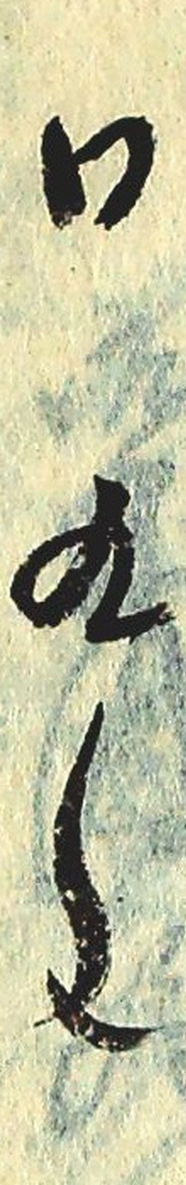同九匁
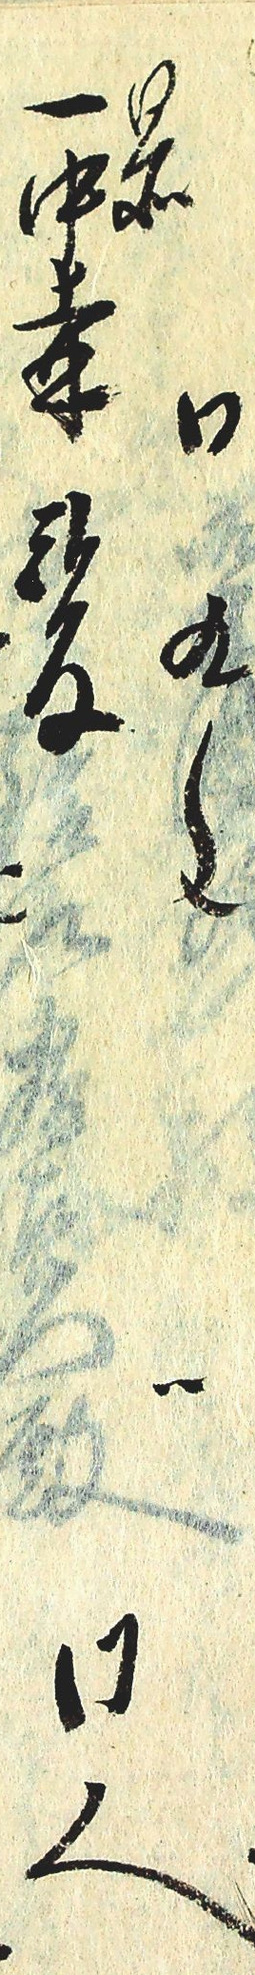一中上林弐反同人
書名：諸御願書控(弐番）
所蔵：鳴門教育大学 Naruto University of Education
